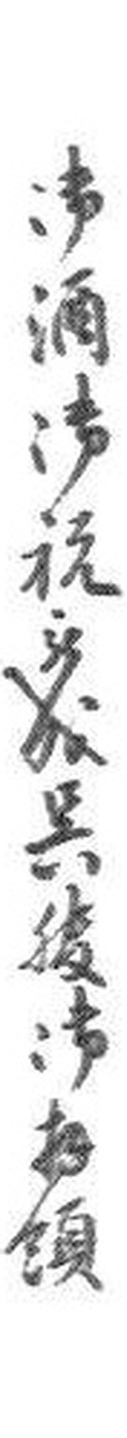御酒御祝被成呉服御拝領
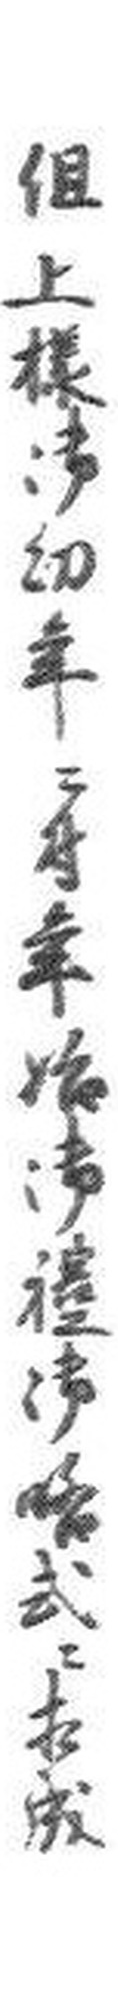但上様御幼年ニ付年始御礼御略式ニ相成
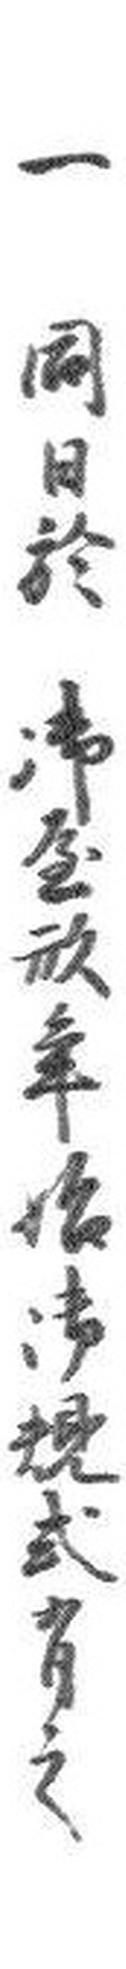一同日於御屋形年始御規式有之
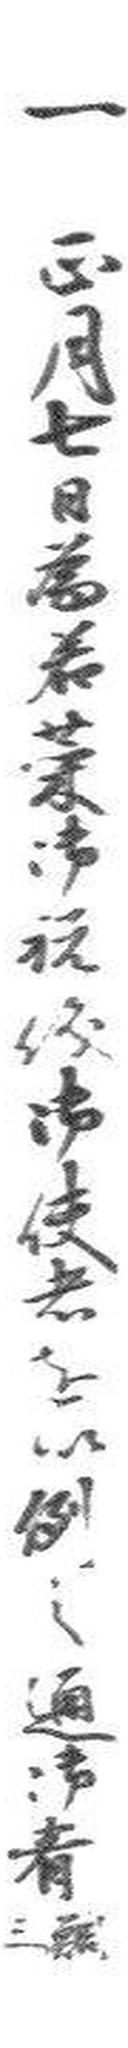一正月七日為若菜御祝儀御使者を以例之通御肴三

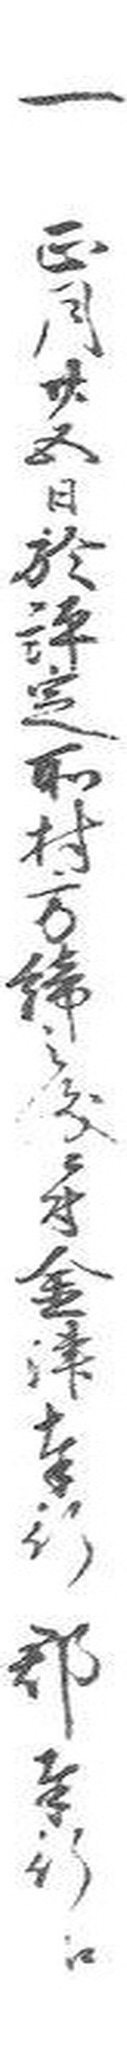一正月廿五日於評定所村方締之儀ニ付金津奉行郡奉行江
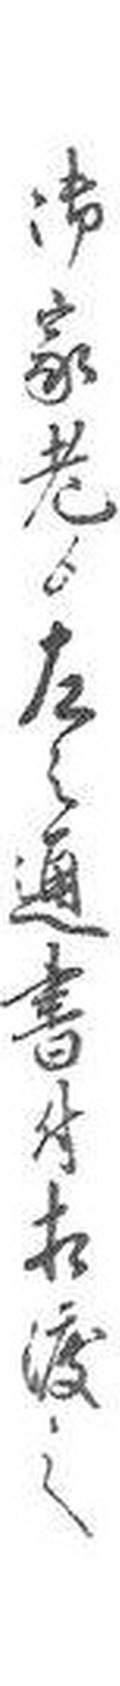御家老ゟ左之通書付相渡之
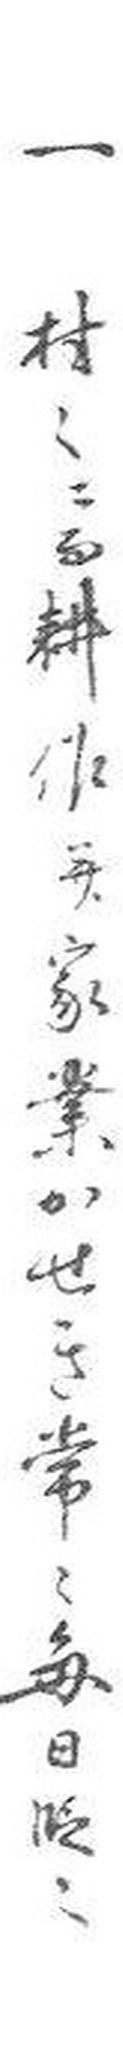一村々ニ而耕作并家業かせき常々毎日段々
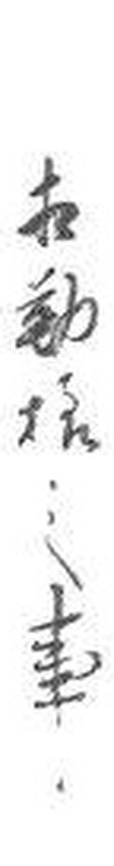相勤様之事
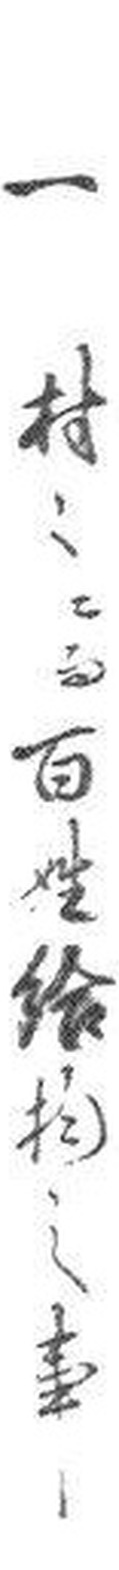一村々ニ而百姓給物之事
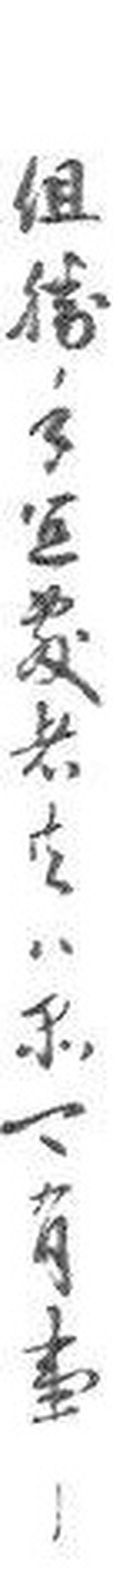但勝手宜敷者共ハ品可有事
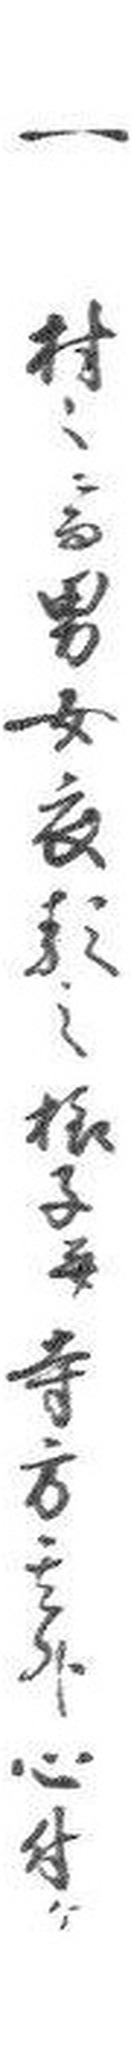一村々ニ而男女衣類之様子并寺方其外心付ケ
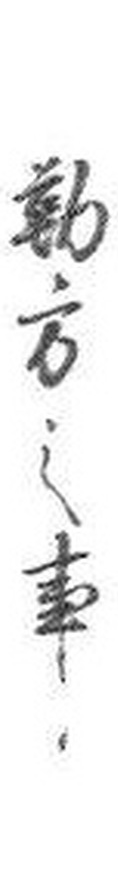勤方之事
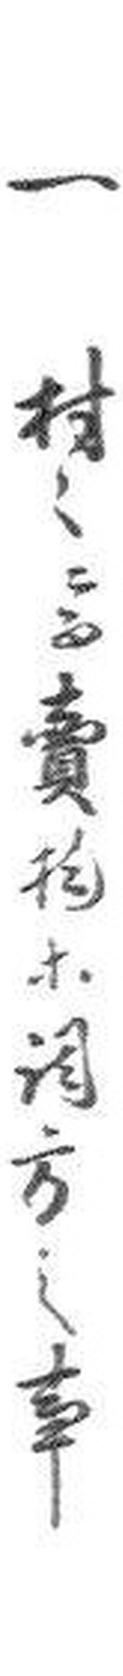一村々ニ而売物等調方之事
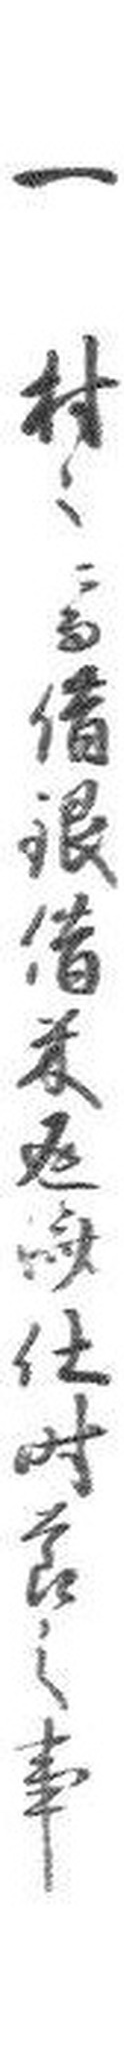一村々ニ而借銀借米返済仕時節之事
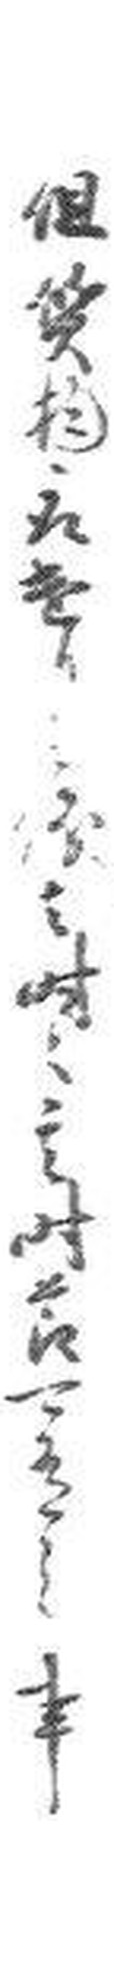但質物取遣リ之儀者其時節可有之事
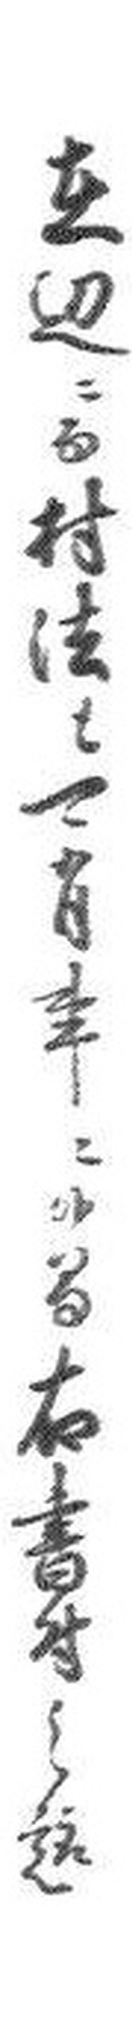在辺ニ而村法も可有事ニ候間右書付之趣
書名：家譜 二十九 吉邦公 従正徳二年到正徳三年
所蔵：福井県文書館 Fukui Prefectural Archives
